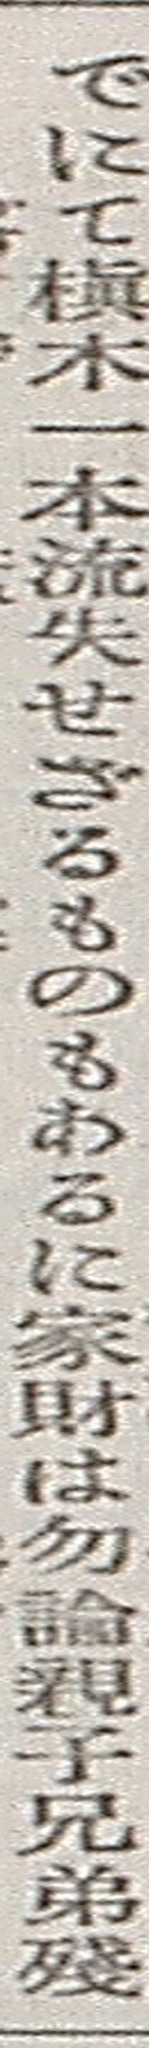でにて槙木一本流失せざるものもあるに家財は勿論親子兄弟残
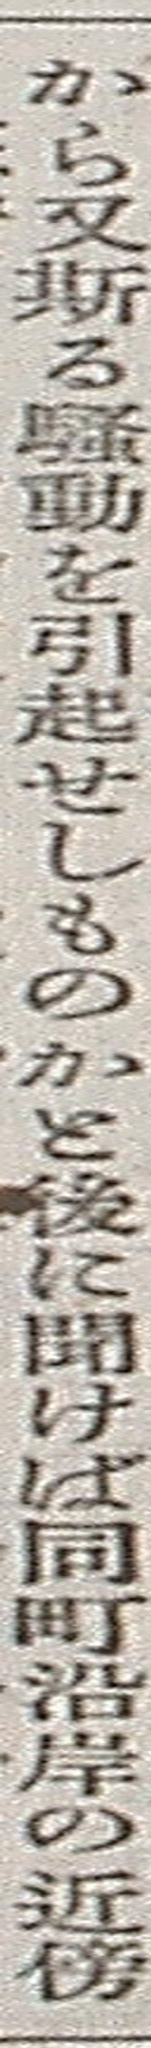から又斯る騒動を引起せしものかと後に聞けば同町沿岸の近傍
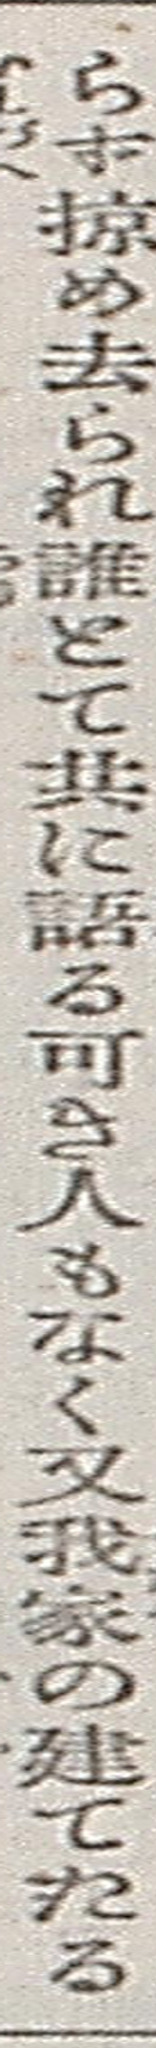らず掠め去られ誰とて共に語る可き人もなく又我家の建てたる
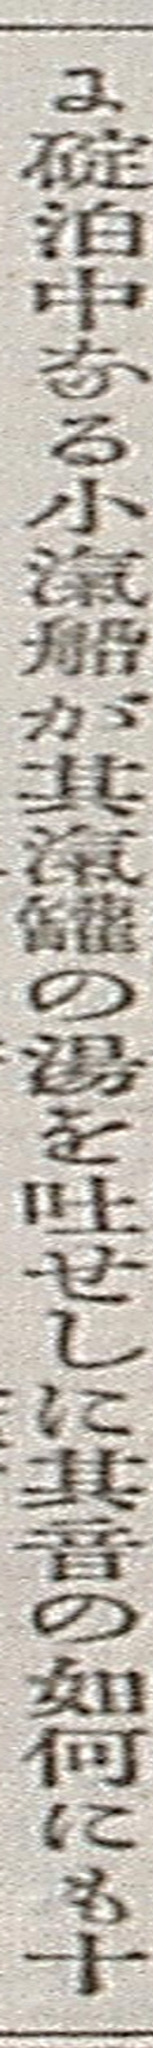に碇泊中なる小汽船が其汽缶の湯を吐せしに其音の如何にも十
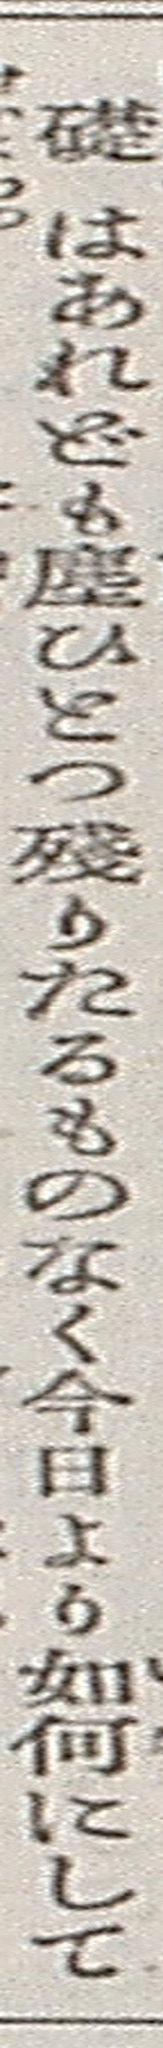礎はあれども塵ひとつ残りたるものなく今日より如何にして
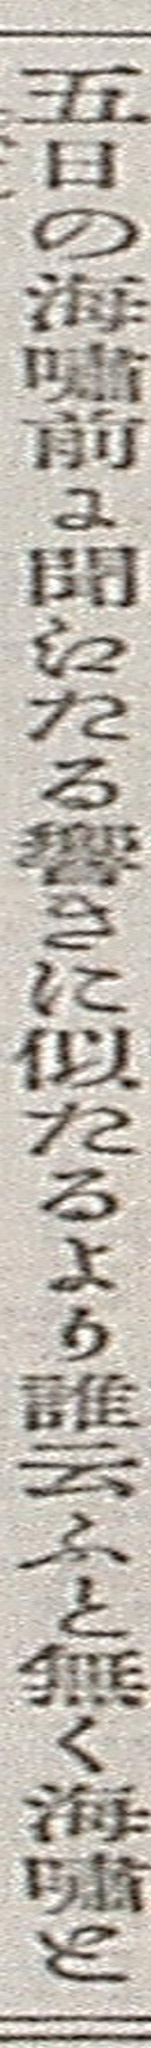五日の海嘯前に聞えたる響きに似たるより誰云ふと無く海嘯と
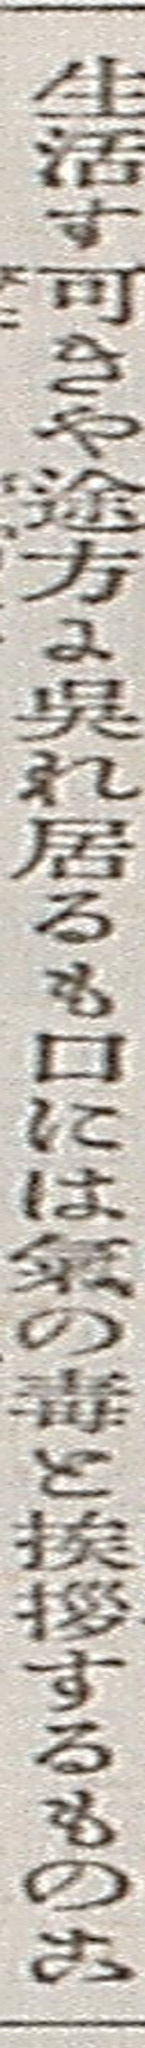生活す可きや途方に呉れ居るも口には気の毒と挨拶するものこ
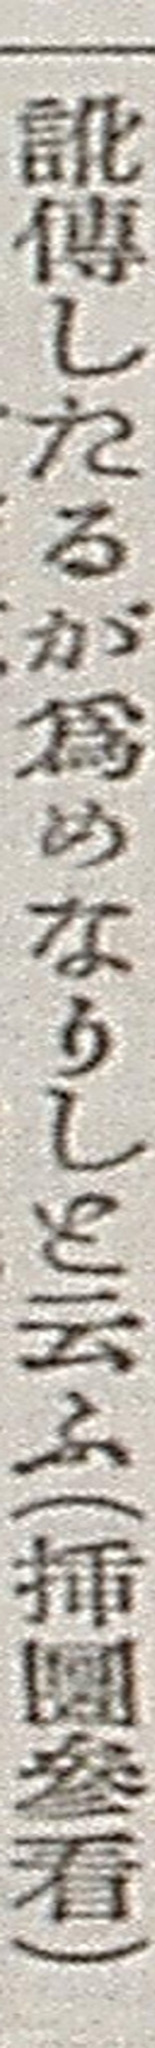訛伝したるが為めなりしと云ふ
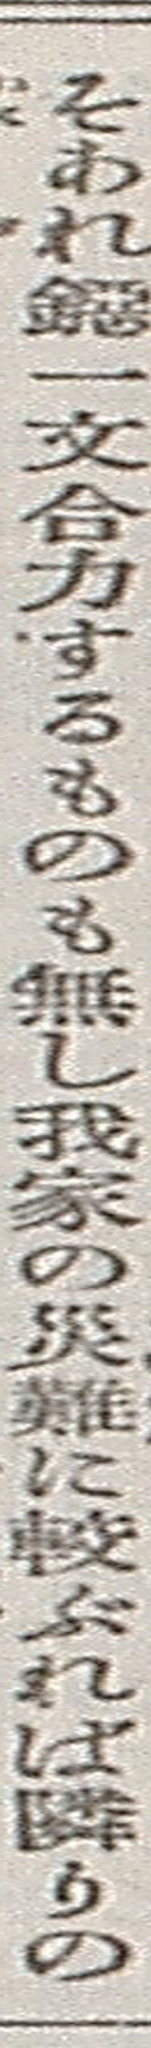そあれ鐚一文合力するものも無し我家の災難に較ぶれば隣りの
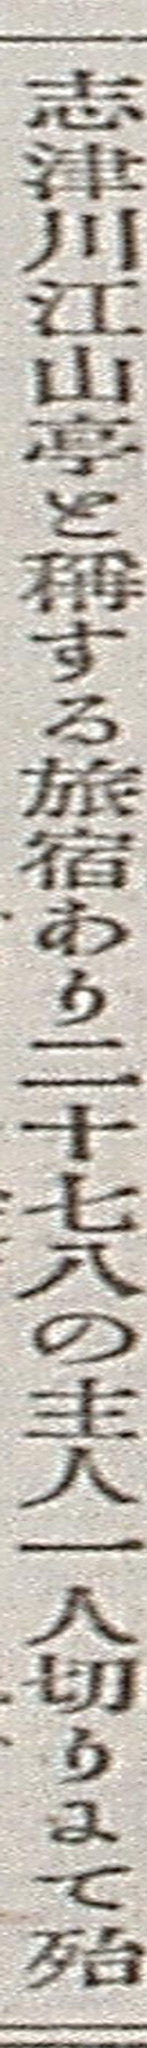志津川江山亭と称する旅宿あり二十七八の主人一人切りにて殆
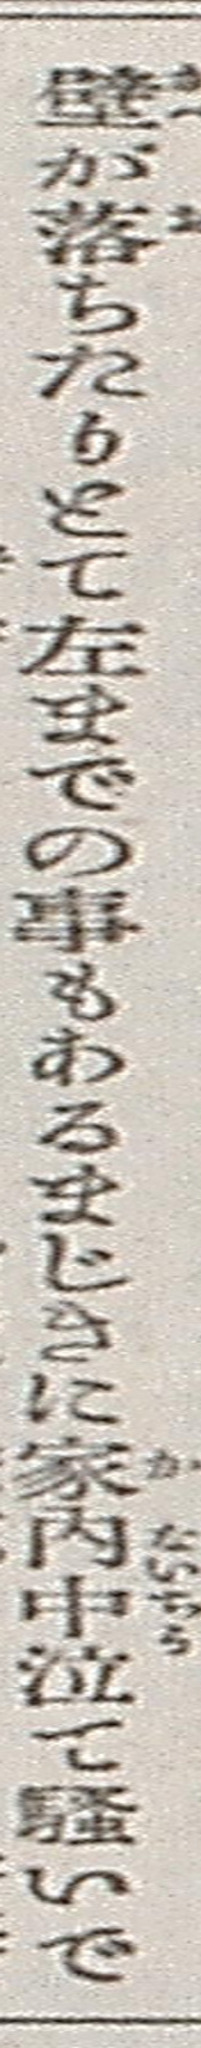壁が落ちたりとて左までの事もあるまじきに家内中泣て騒いで
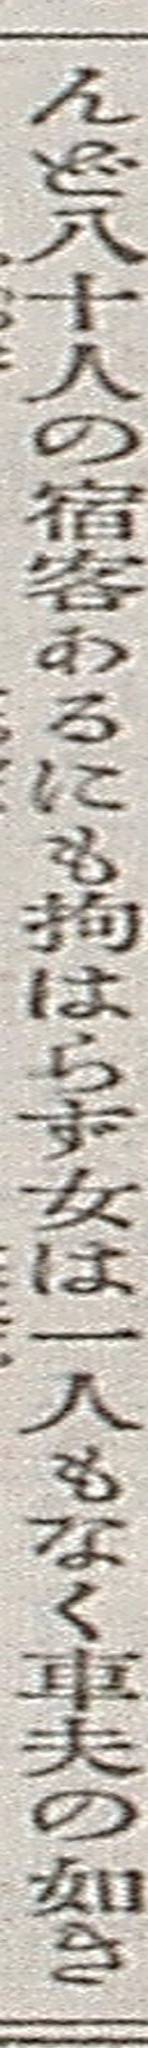んど八十人の宿客あるにも拘はらず女は一人もなく車夫の如き
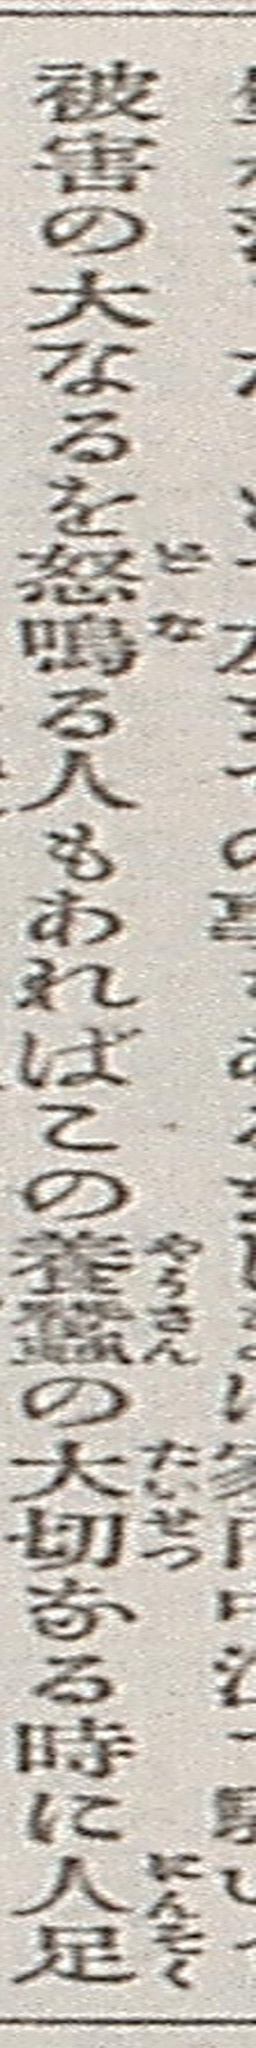被害の大なるを怒鳴る人もあればこの養蚕の大切なる時に人足
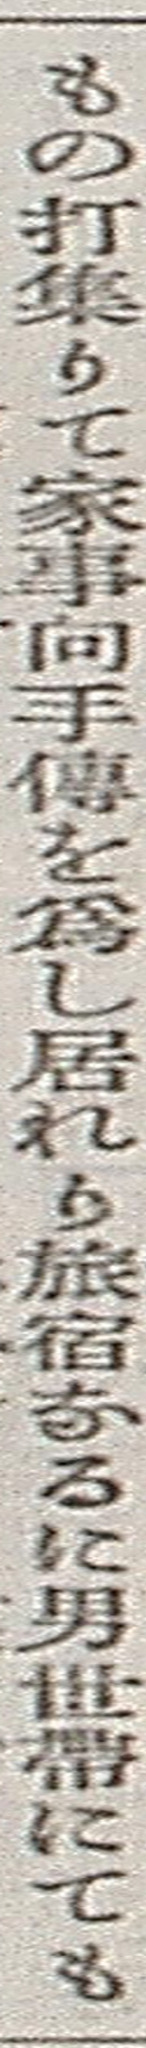もの打集りて家事向手伝を為し居れり旅宿なるに男世帯にても
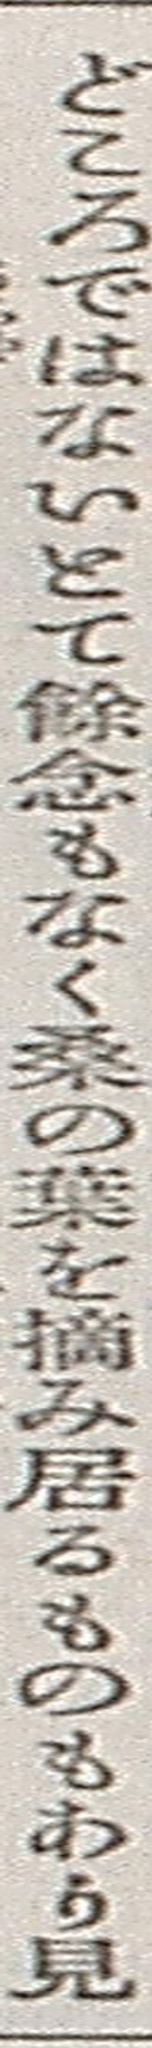どころではないとて余念もなく桑の葉を摘み居るものもあり見
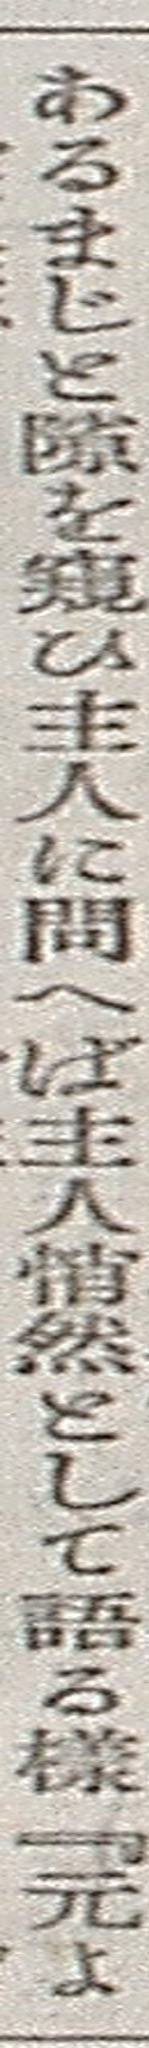あるまじと隙を窺ひ主人に問へば主人悄然として語る様『元よ
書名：風俗畫報臨時増刊第百十九號　大海嘯被害録（中）
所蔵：東京大学地震研究所図書室 Earthquake Research Institute Library, The University of Tokyo, JAPAN
